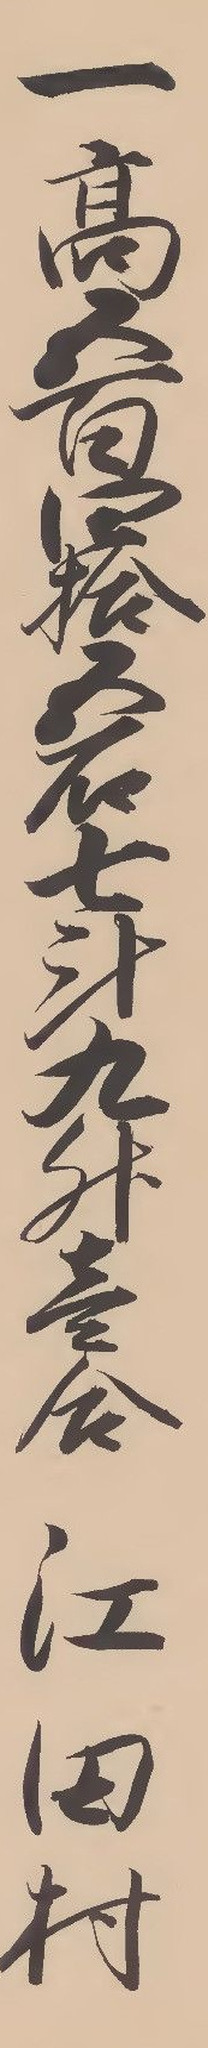一高五百四拾五石七斗九升壱合江田村
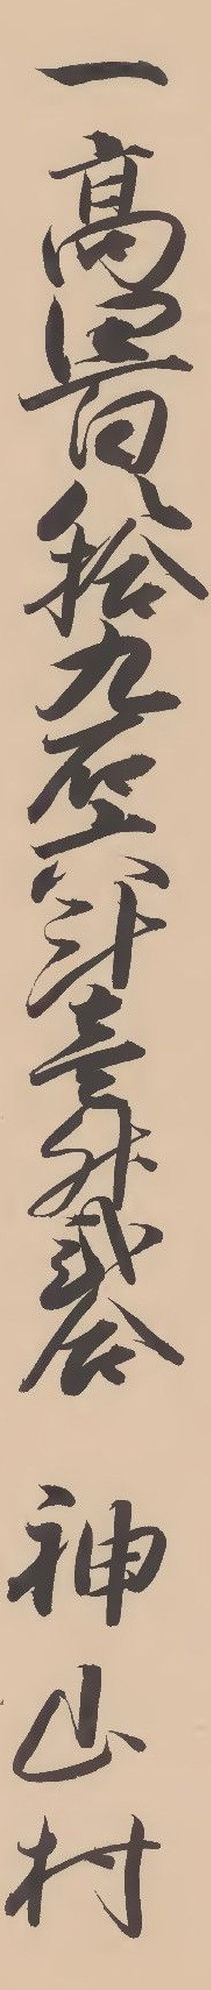一高四百八拾九石六斗壱升弐合神山村
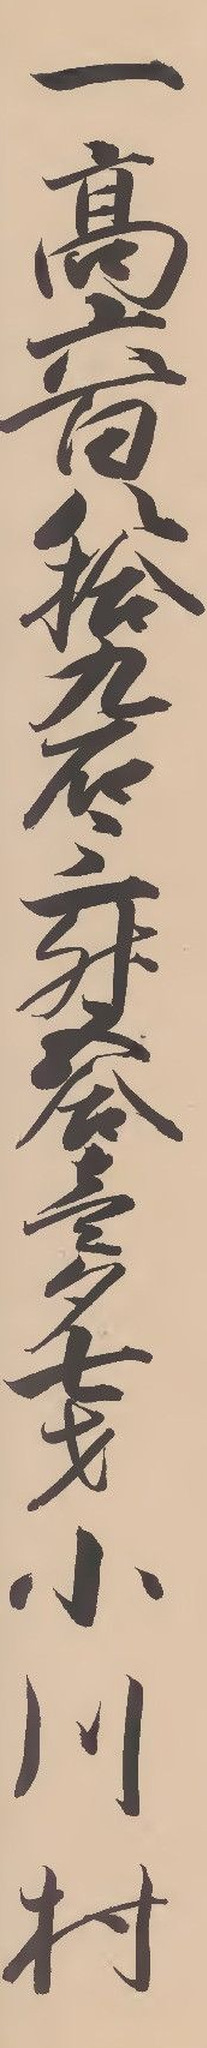一高六百八拾九石三升五合壱勺七才小川村
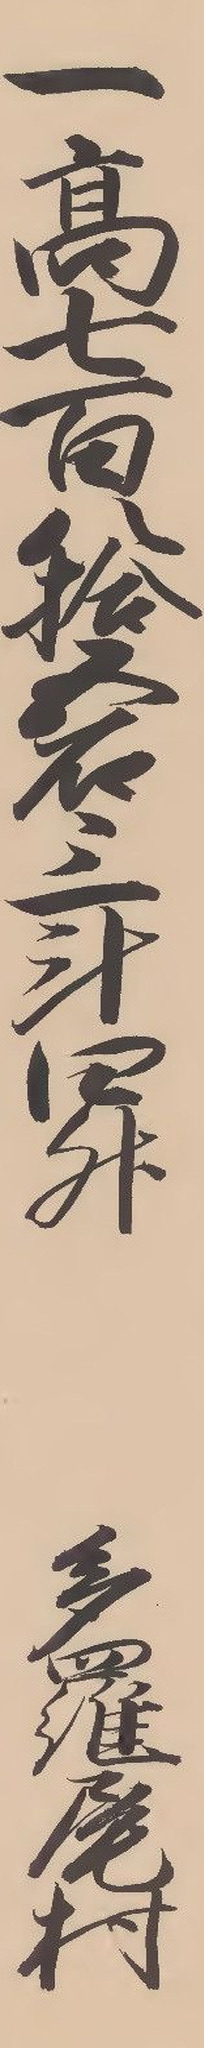一高七百八拾五石三斗四升多羅尾村
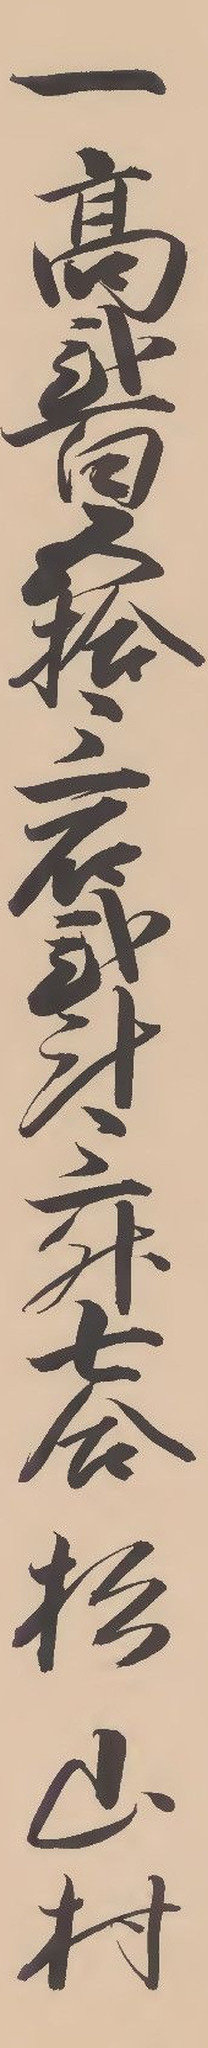一高弐百五拾三石弐斗三升七合杉山村

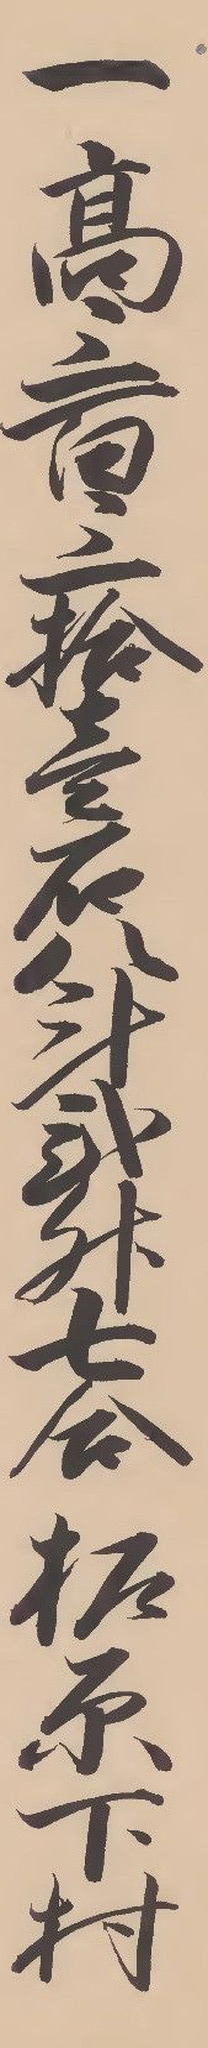一高三百三拾壱石八斗弐升七合松原下村
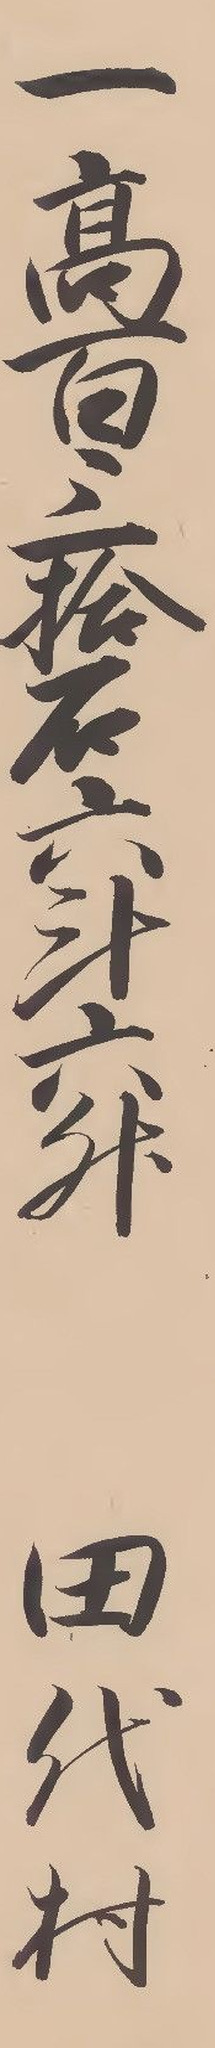一高百三拾石六斗六升田代村
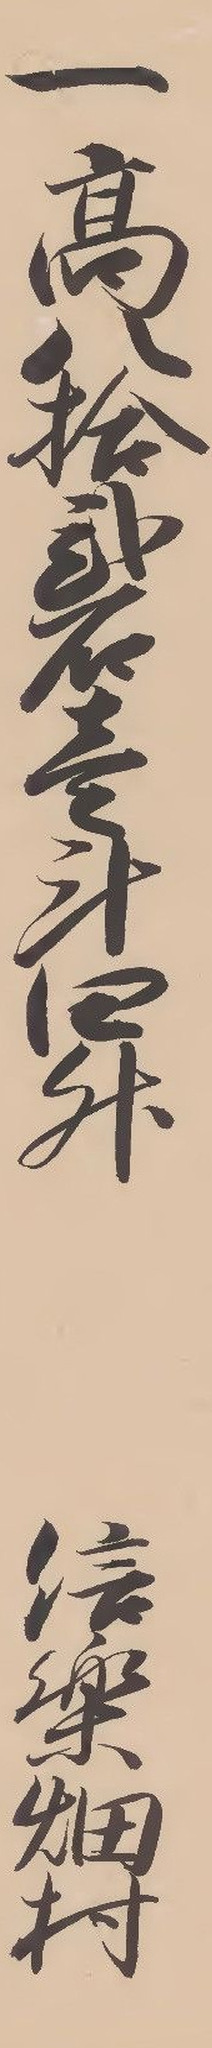一高八拾弐石壱斗四升信楽畑村
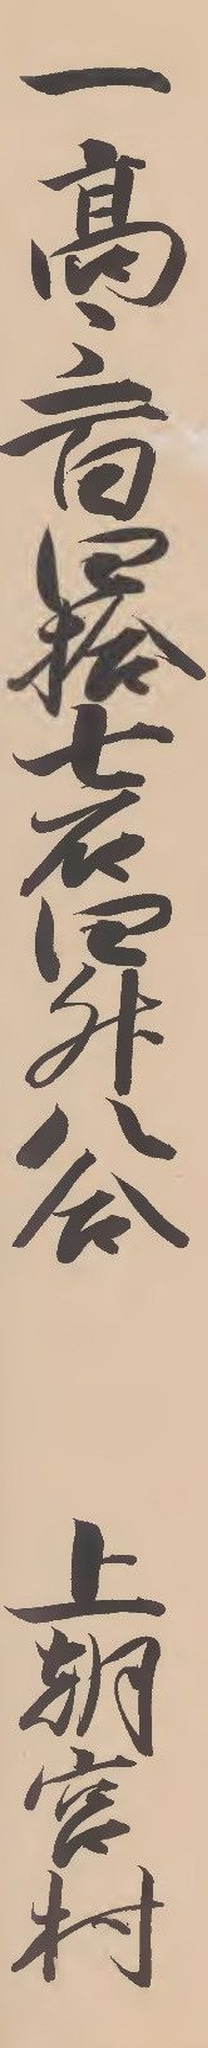一高三百四拾七石四升八合上朝宮村
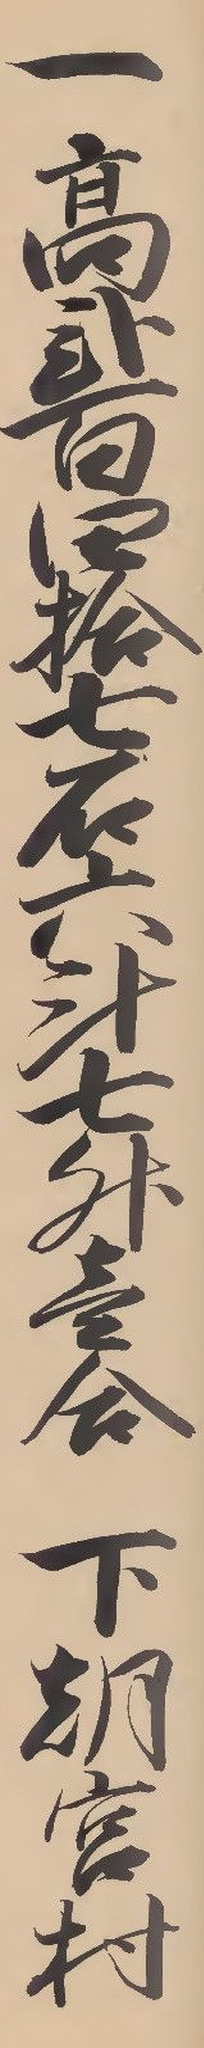一高弐百四拾七石六斗七升壱合下朝宮村
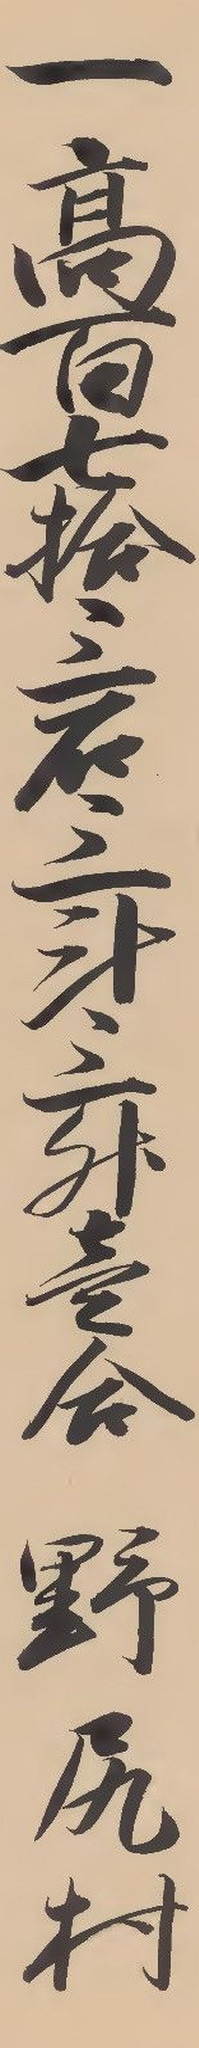一高百七拾三石三斗三升壱合野尻村
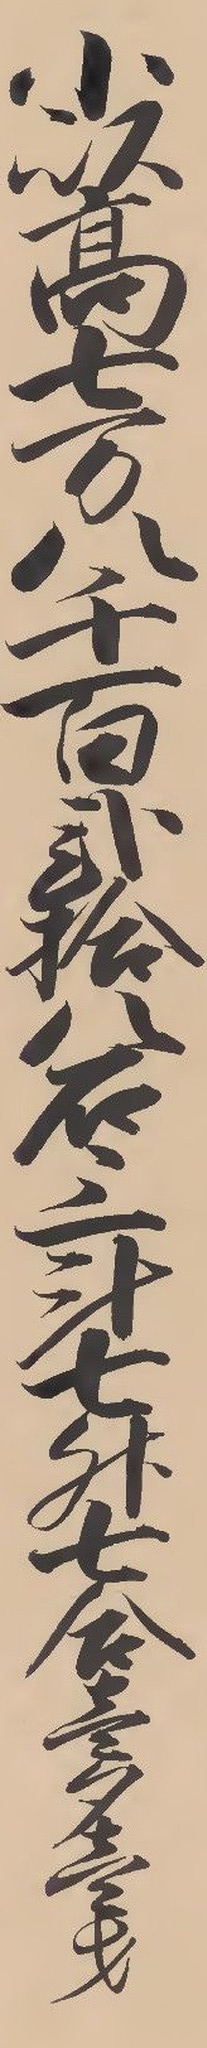小以高七万八千百弐拾八石三斗七升七合壱勺壱才

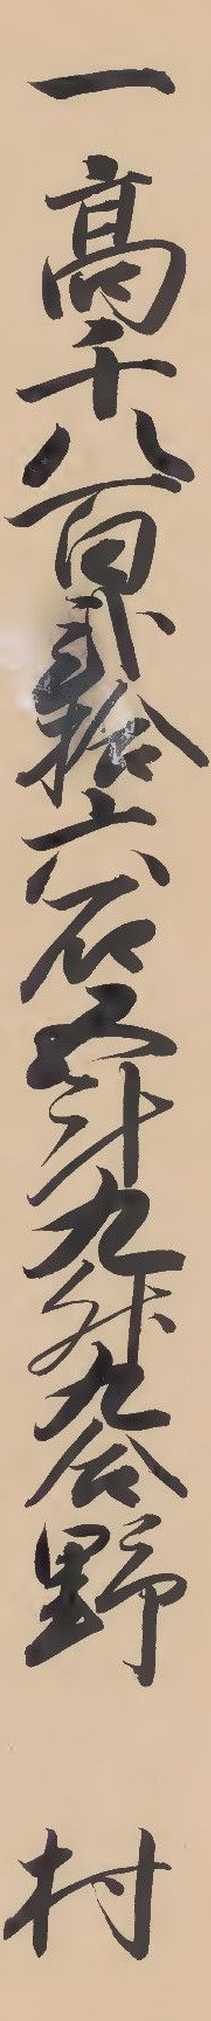一高千八百弐拾六石五斗九升九合野村
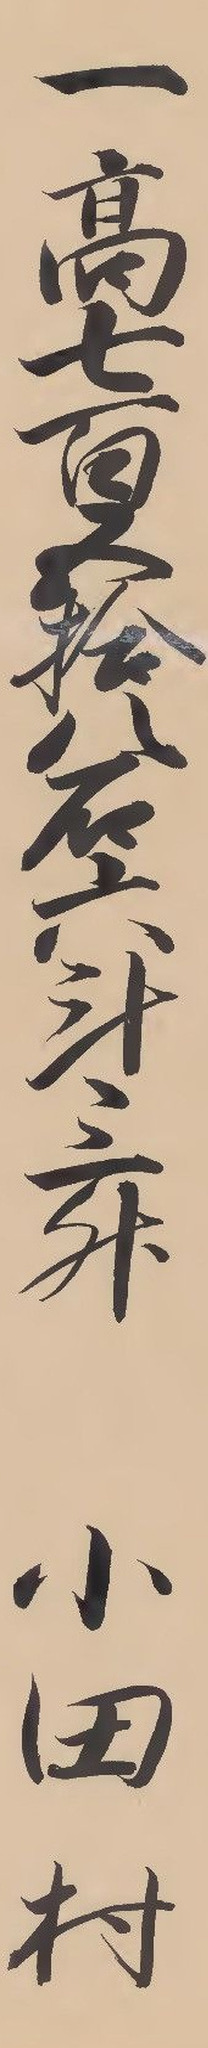一高七百五拾八石六斗三升小田村
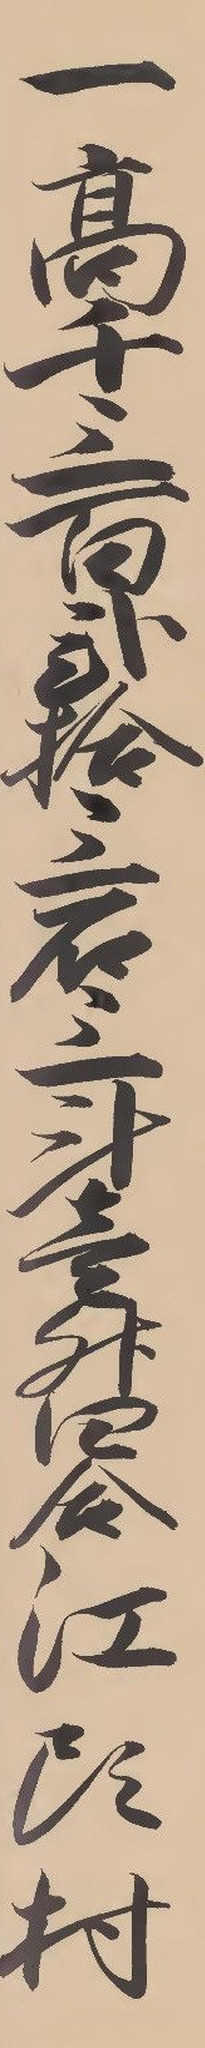一高千三百弐拾三石三斗壱升四合江頭村
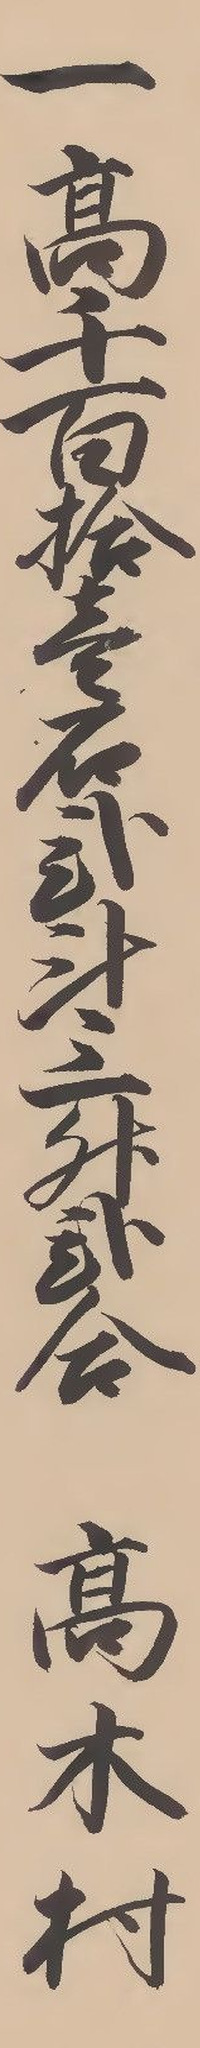一高千百拾壱石弐斗三升弐合高木村
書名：近江国郷帳
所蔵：国立公文書館 National Archives of Japan
